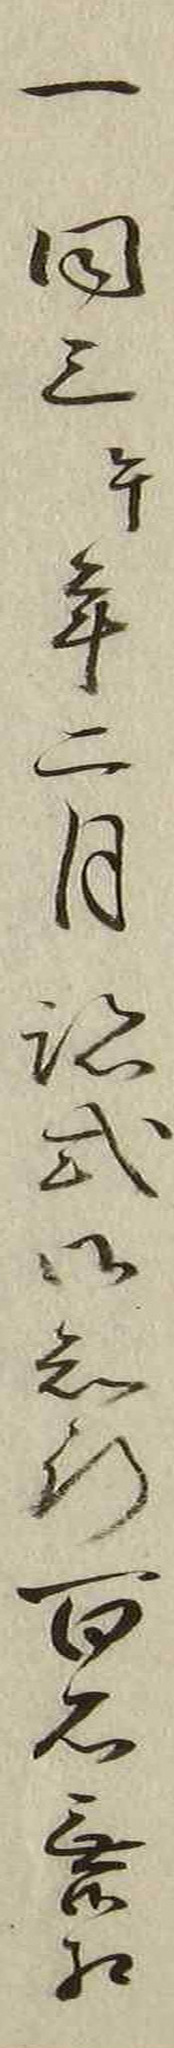一同三午年二月跡式御知行百石無御相
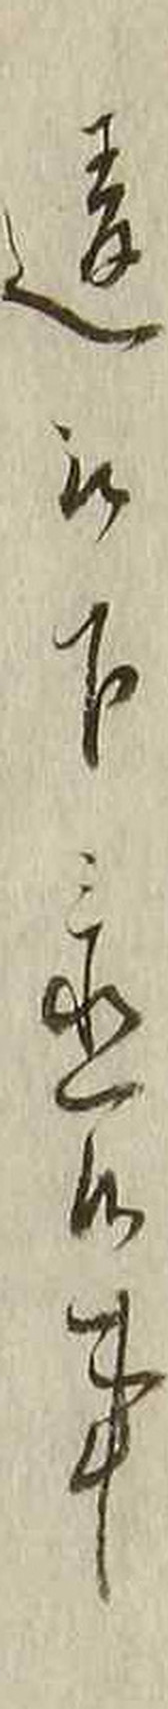違被下置候事
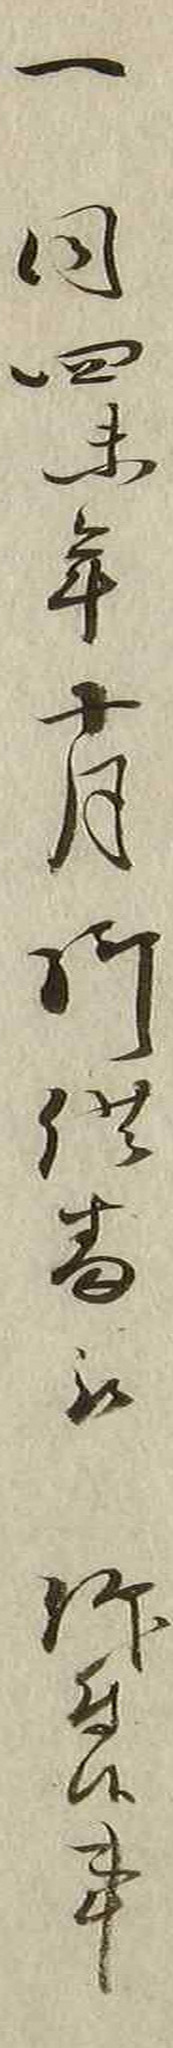一同四未年十月御供番被仰付候事
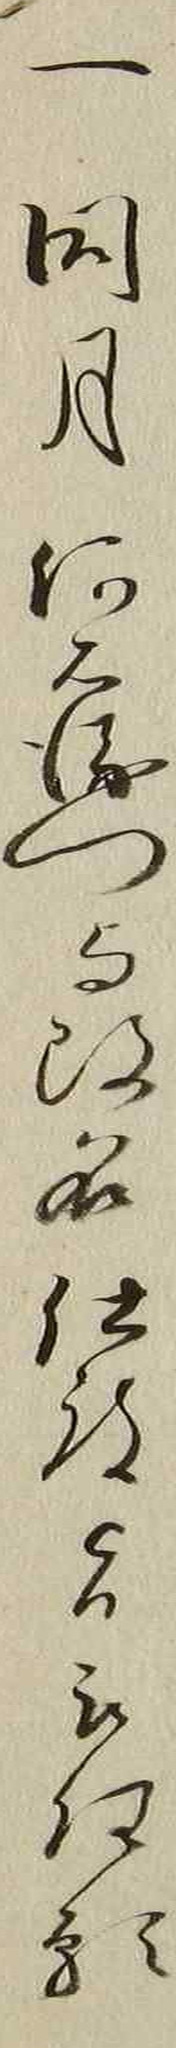一同月何右衛門与改名仕度旨被任願
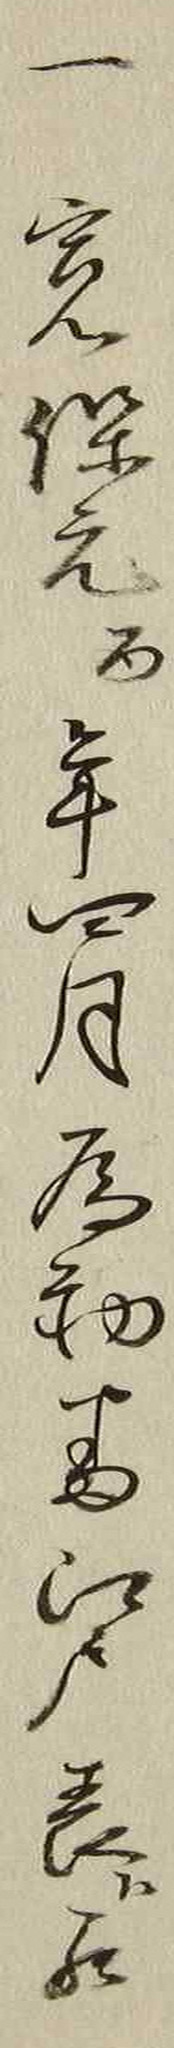一寛保元酉年四月為勤番江戸表江罷
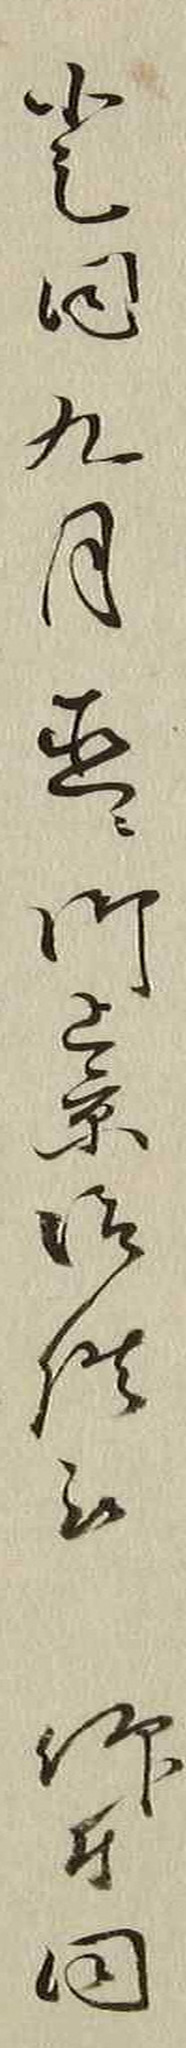登同九月直ニ御上京御供被仰付同
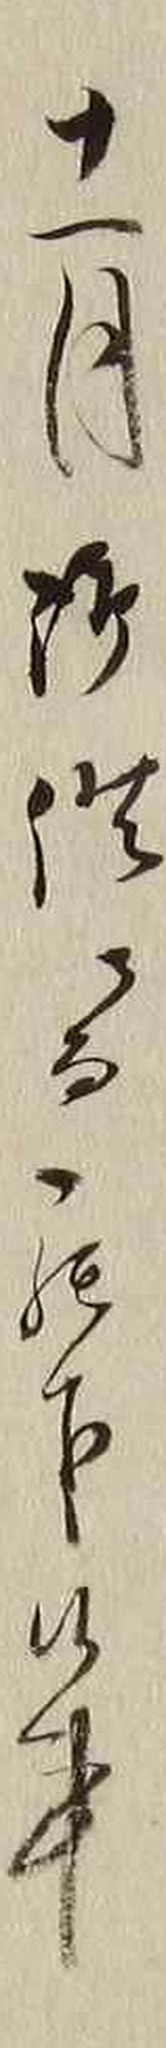十一月御供ニ而罷下候事
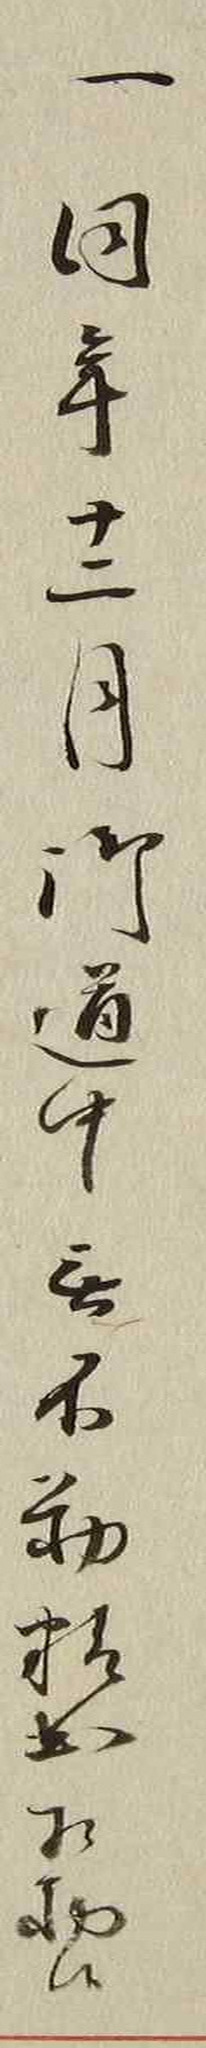一同年十二月御道中無不勤精出相勤候
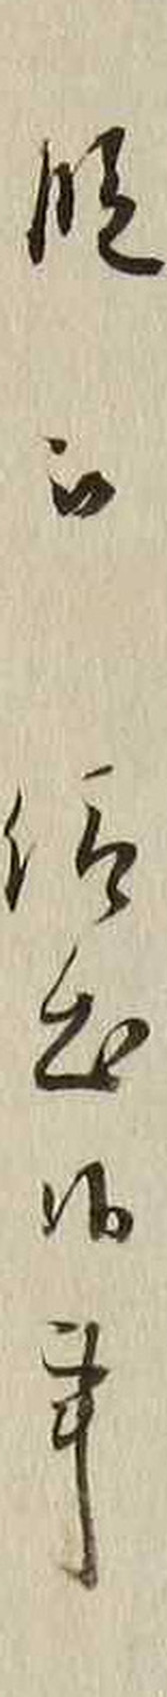段被仰出候事
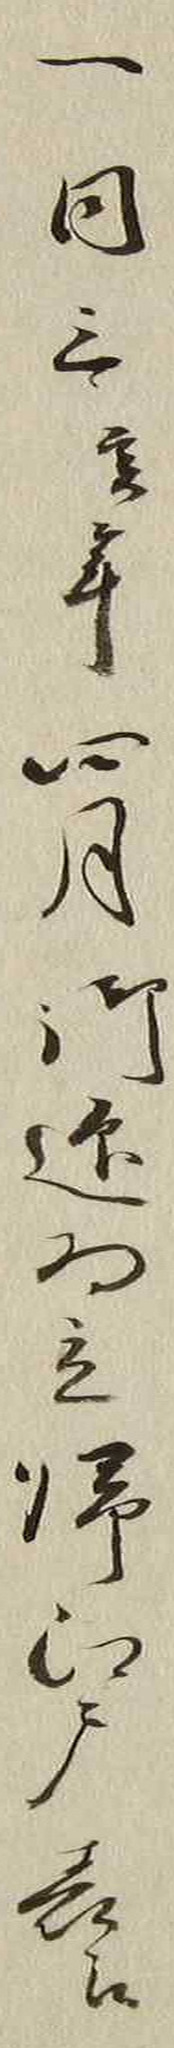一同三亥年四月御迎為立帰江戸表江
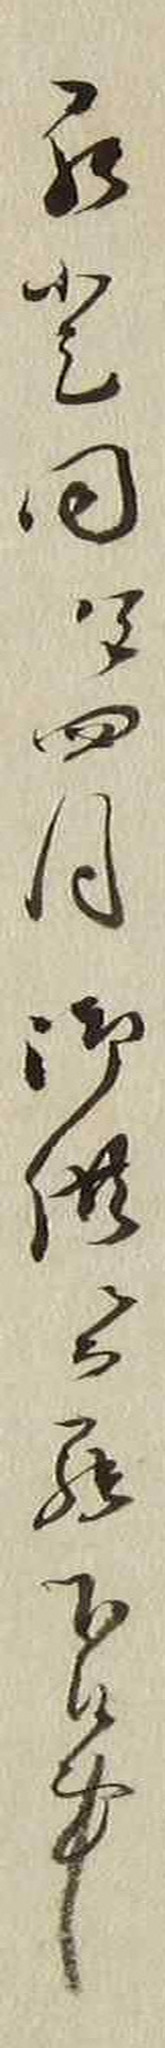罷登同閏四月御供ニ而罷下候事
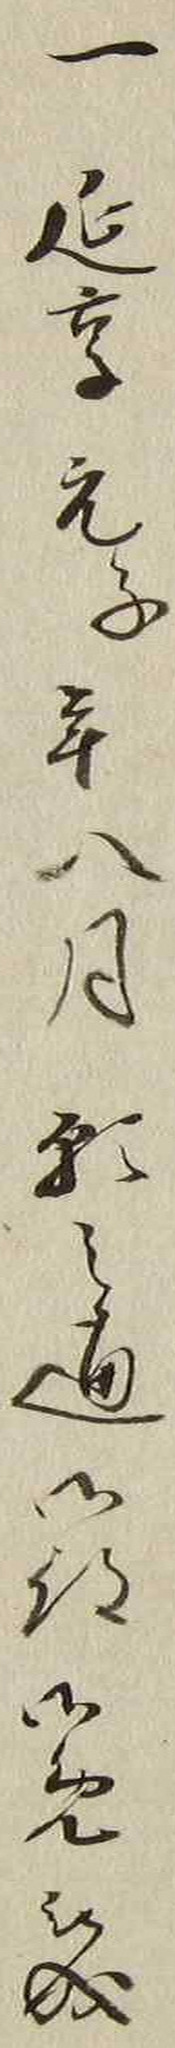一延享元子年八月願之通御役御免被成
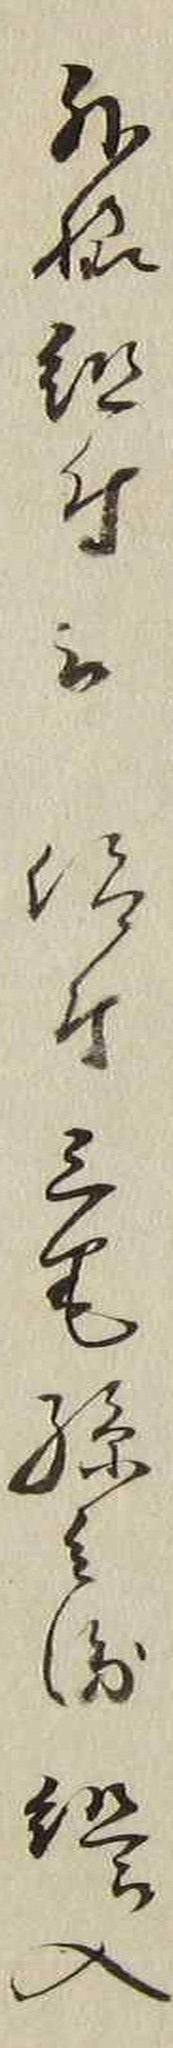外様組付被仰付三宅孫兵衛組江入
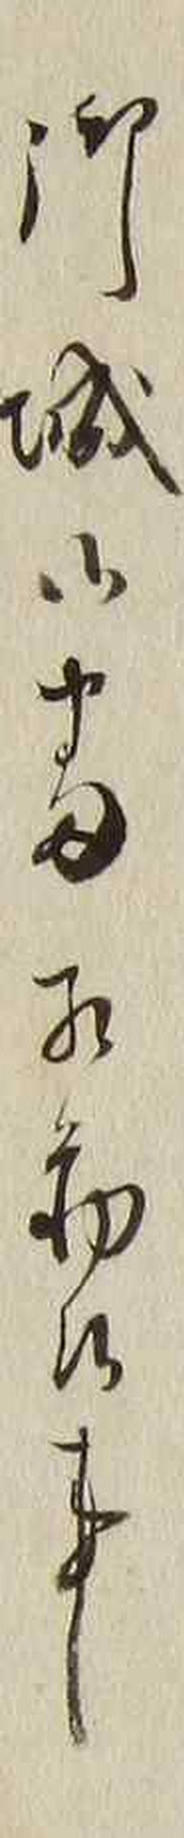御城御番相勤候事
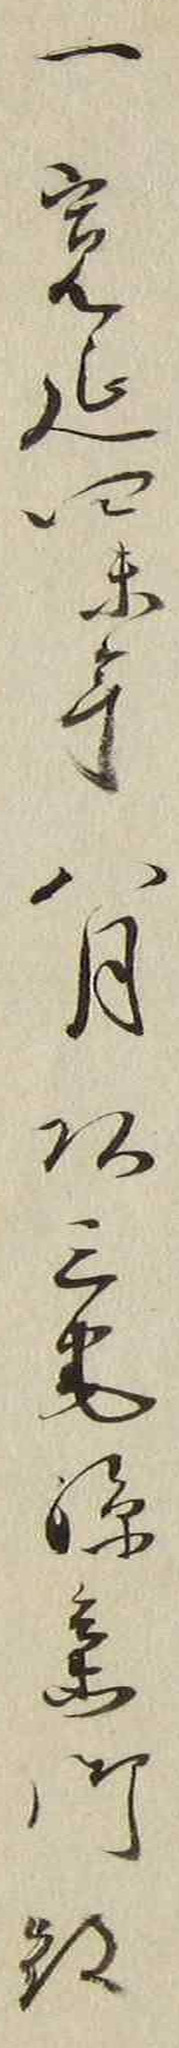一寛延四未年八月頭三宅孫兵衛御役
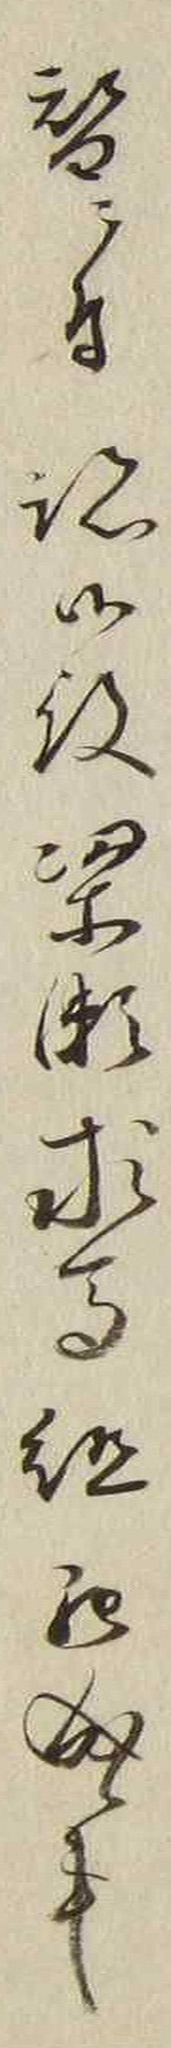替ニ付跡御役梁瀬求馬組罷成候事
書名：諸士系譜　巻之25　い之部25
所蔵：会津若松市立会津図書館
